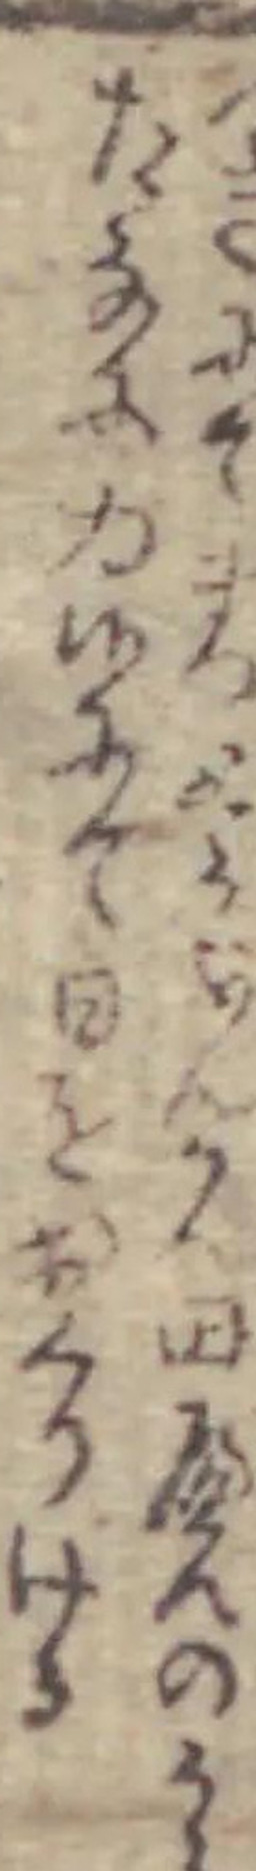たなにゐ候にて日をおくりける
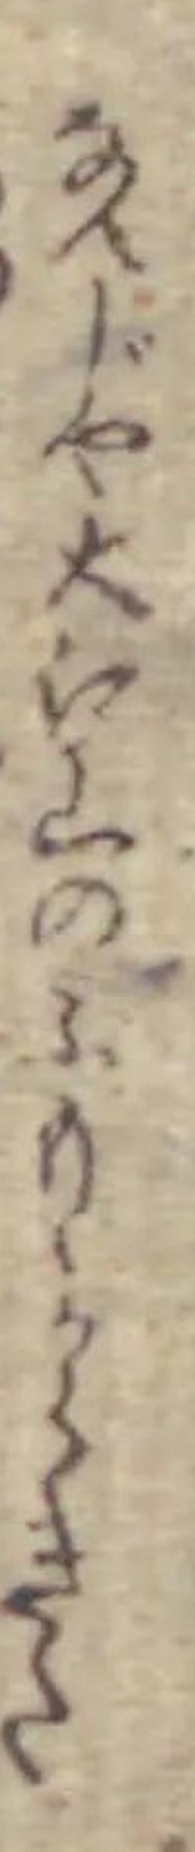なんじや大江山のふもとからきた
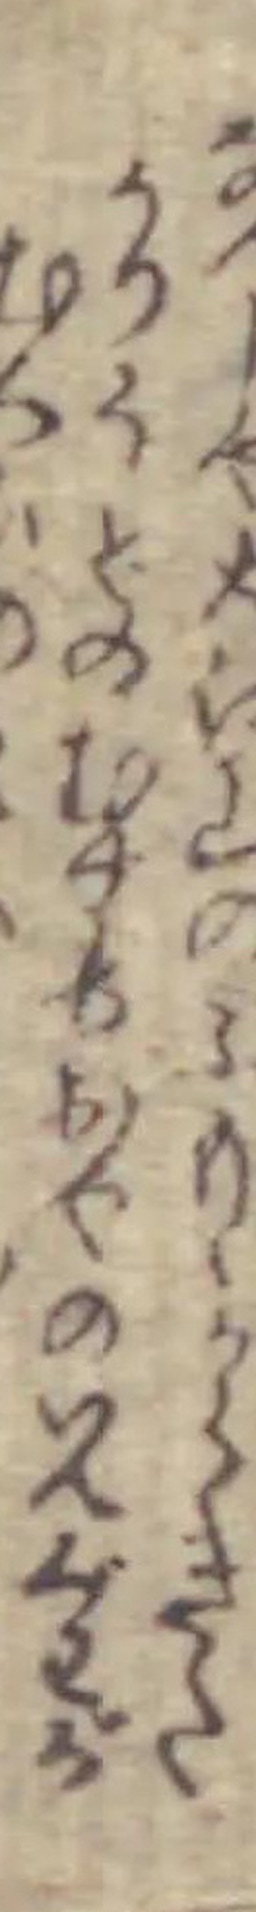かりうどのむすめおやのいんぐわが
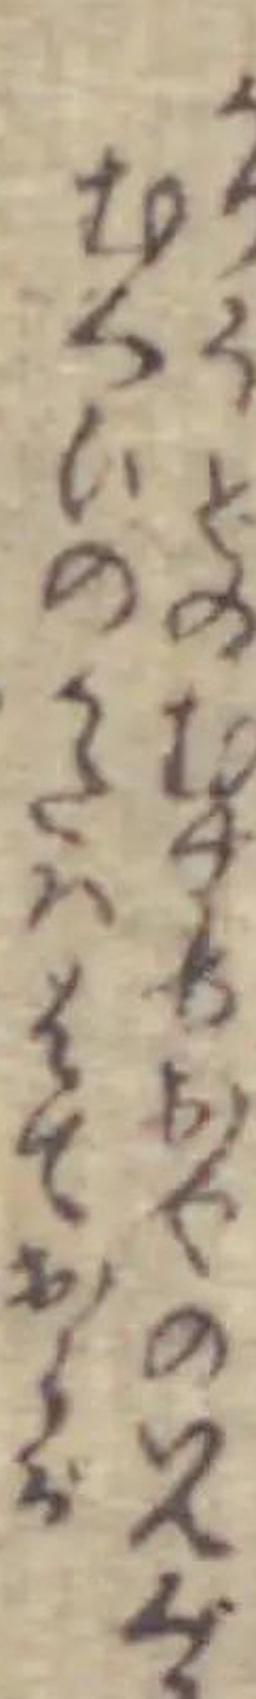むくひのかたははておらが
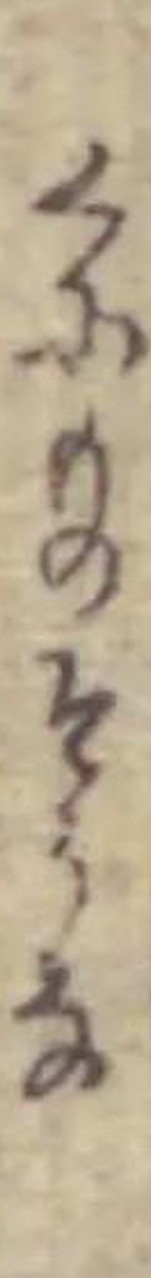くにものそうな
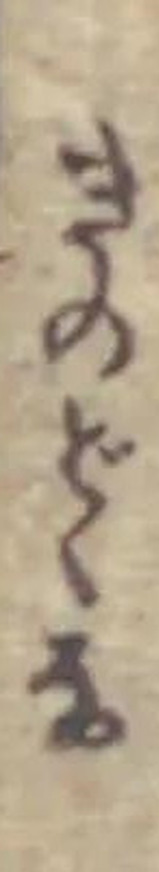きのどくな

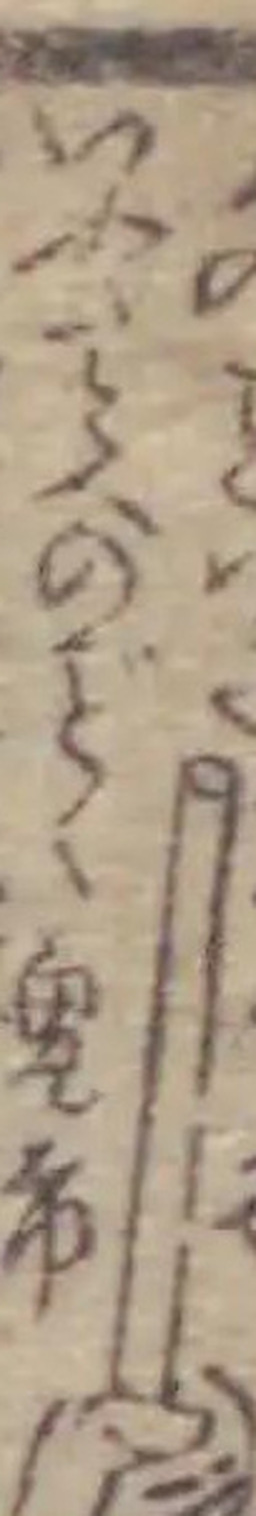いふたとへのごとく鬼市
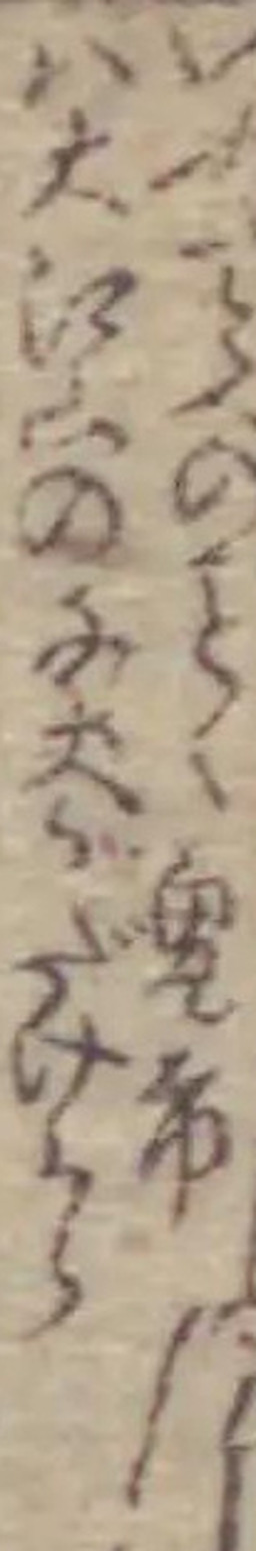は大江山の千丈がだけから
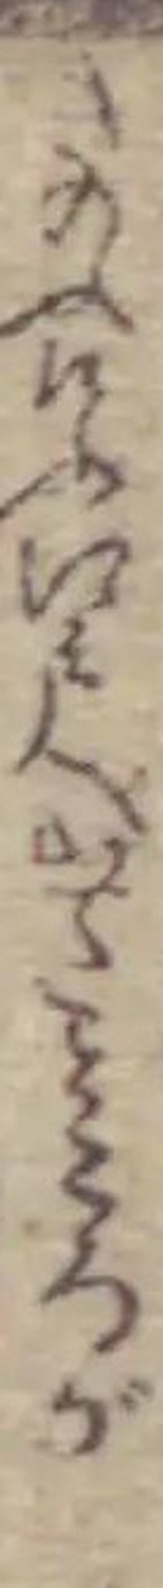きのふけふ江戸へ出たところが
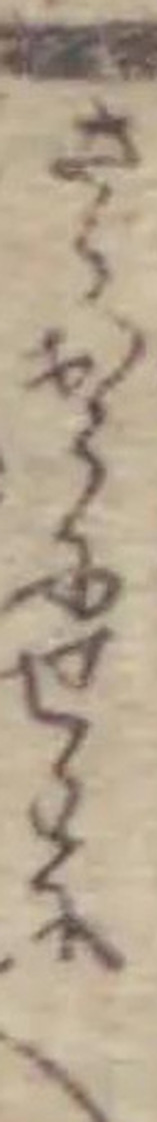さうおうにせわに
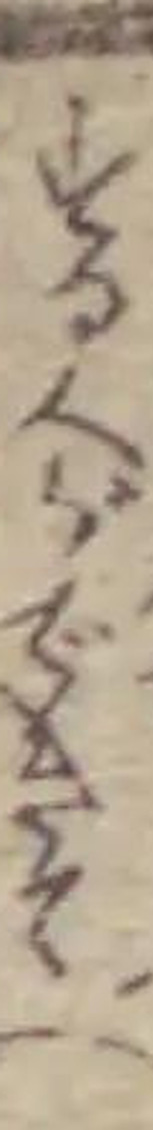する人ができて
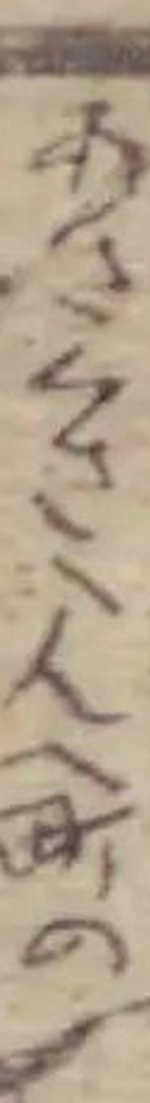あさくさへんへ町の
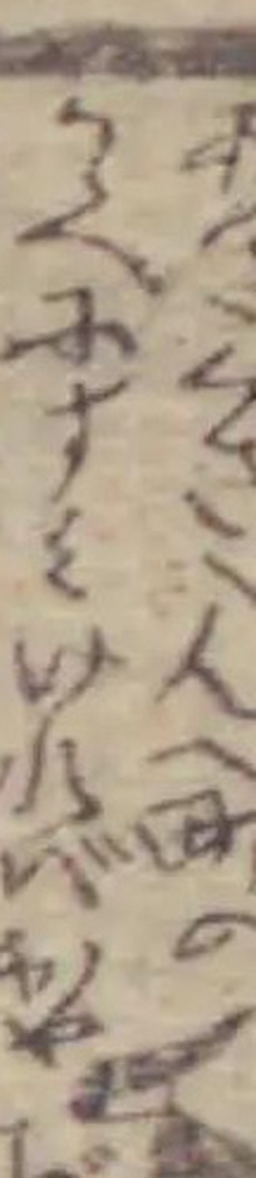かゝへにすみければおやぢ
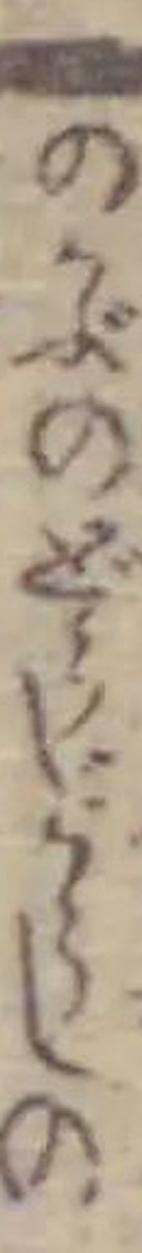のかぶのどうじかうしの
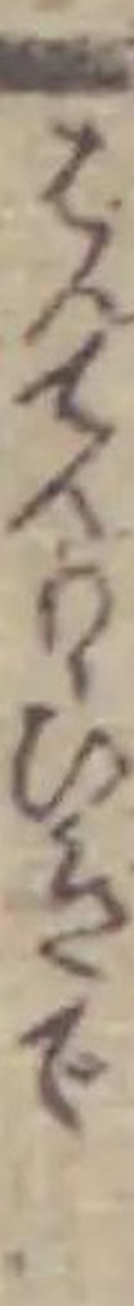はんてんもゝひきで
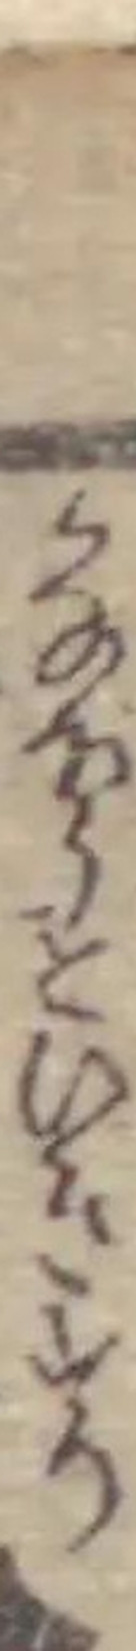かなぼうをひきすり
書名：鬼子宝 3巻
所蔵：国立国会図書館 National Diet Library, JAPAN
